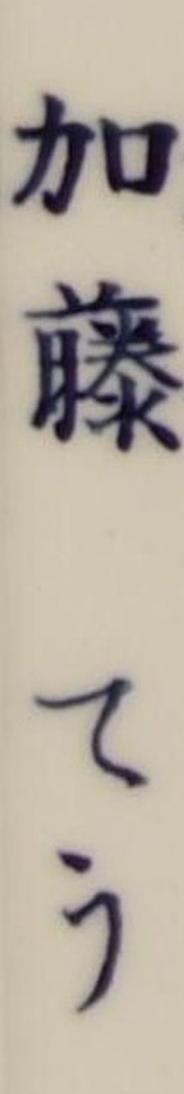加藤てう

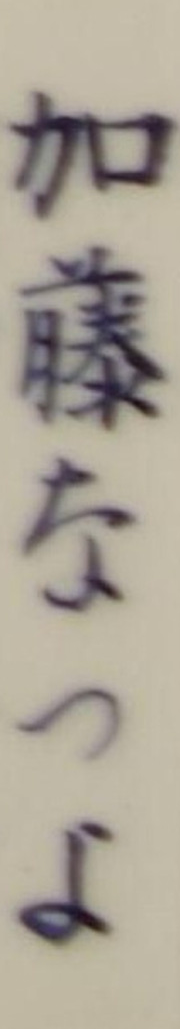加藤なつよ
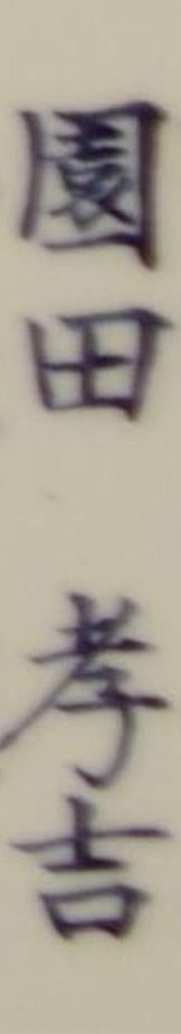園田孝吉
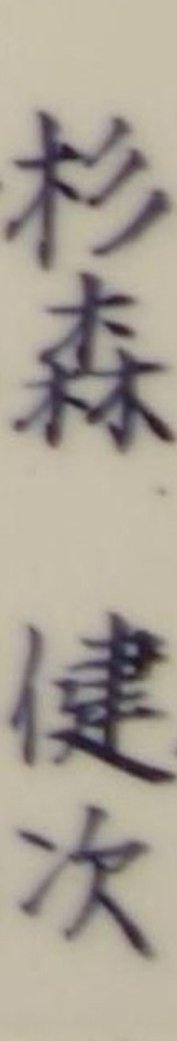杉森健次
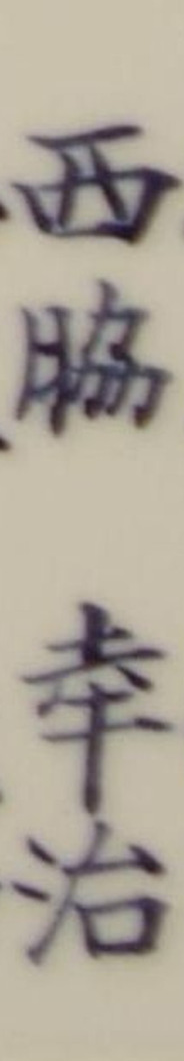西脇幸治
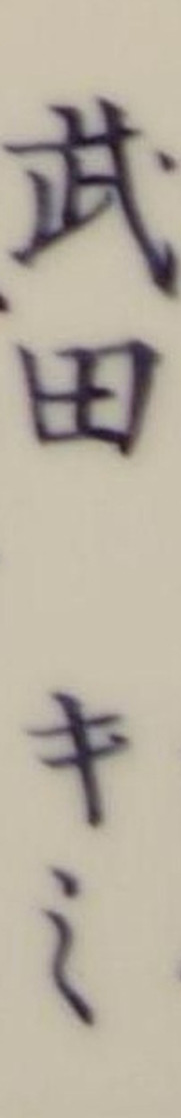武田キミ
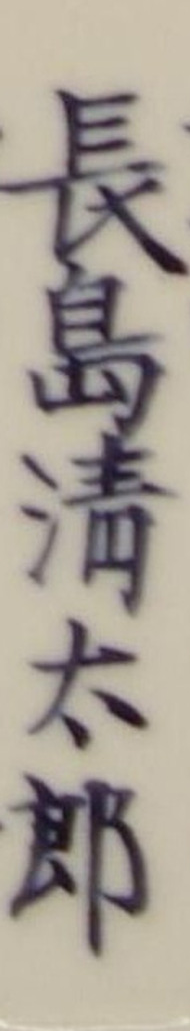長島清太郎
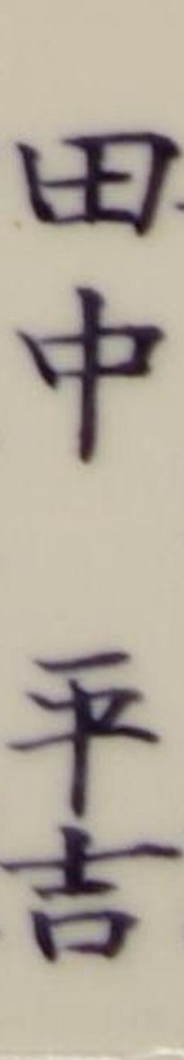田中平吉
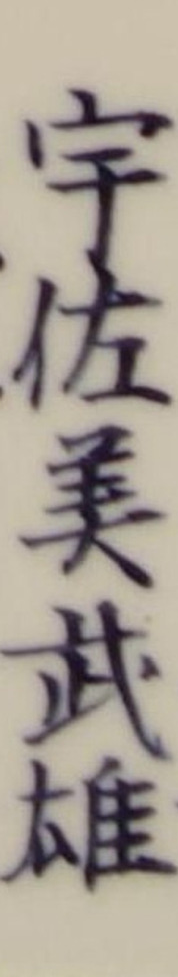宇佐美武雄
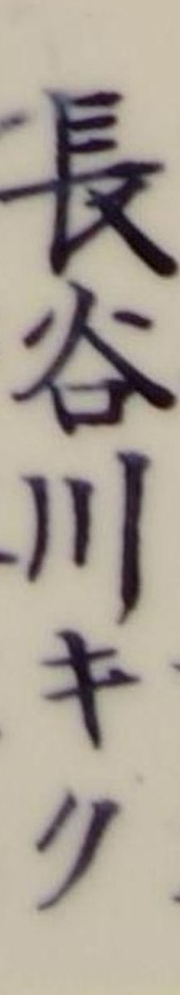長谷川キク
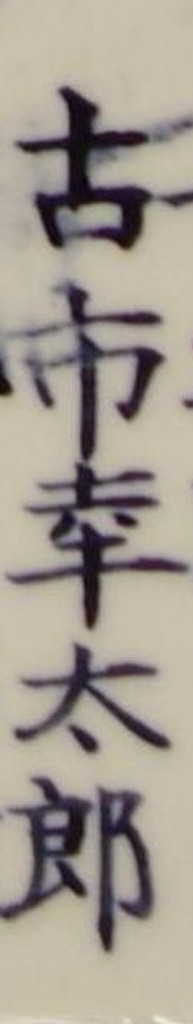古市幸太郎
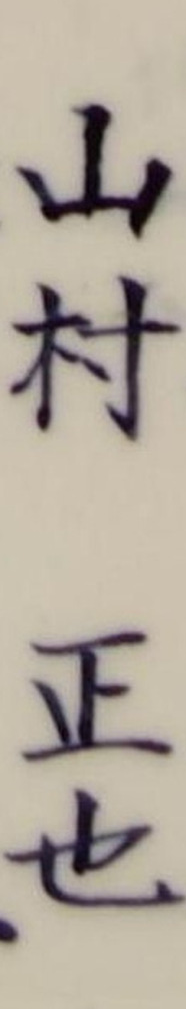山村正也
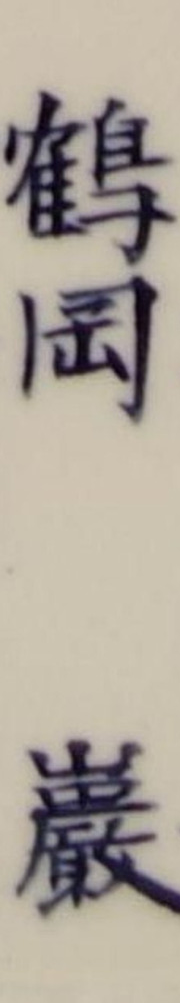鶴岡巌
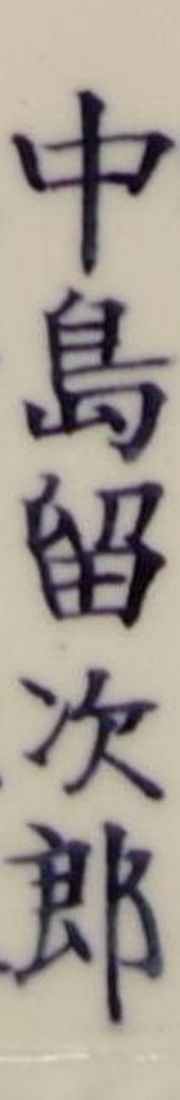中島留次郎
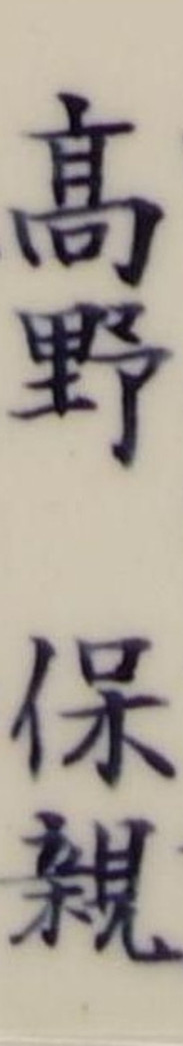高野保親
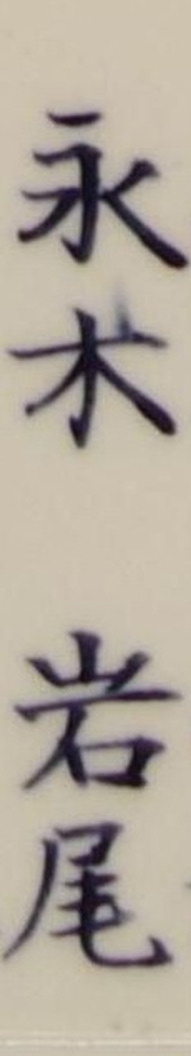永木岩尾
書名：E~L
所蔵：高野山金剛峯寺
